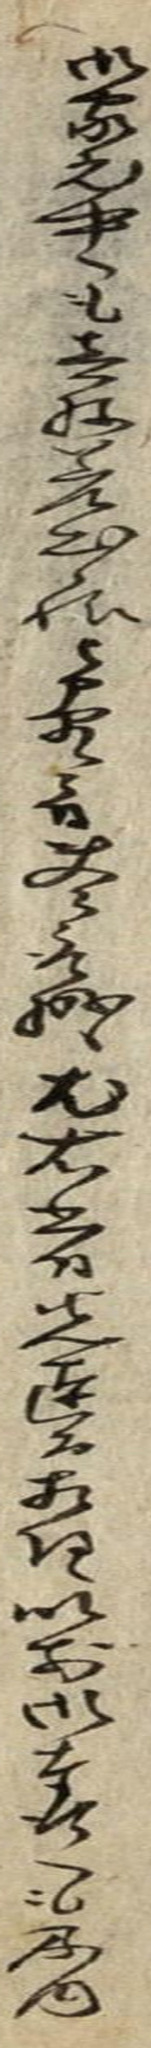御家老中へも壱枚差出候様被申聞候に付夫々取扱候尤書付先達而相伺候以前御奉行へも及内
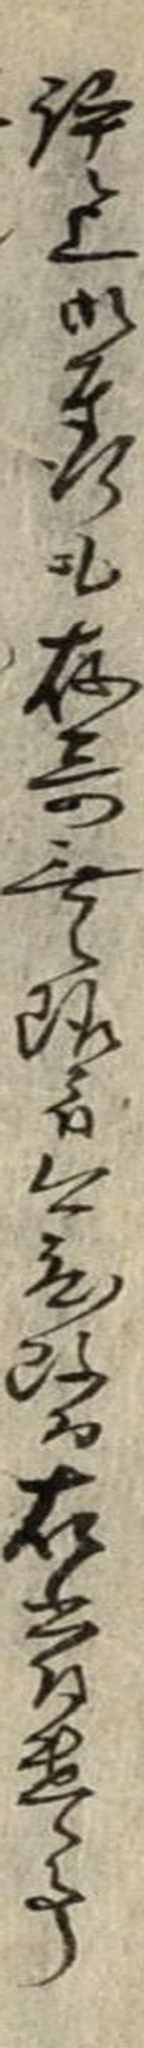評候上御奉行も存寄無之趣に付今度改而右書付遣候事
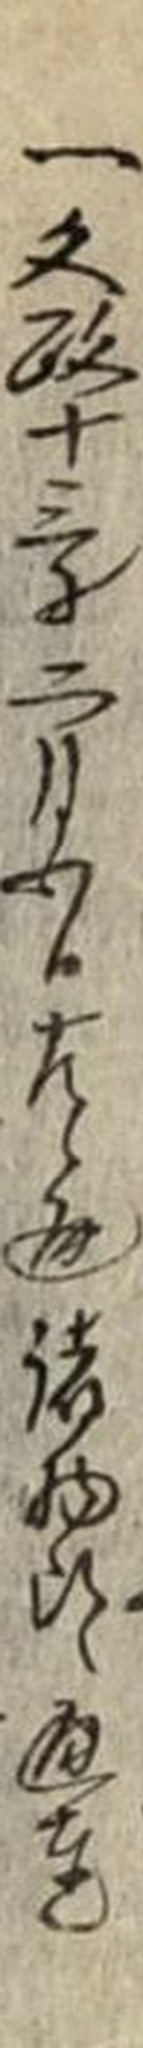一文政十三寅二月五日左之通諸物頭へ通達
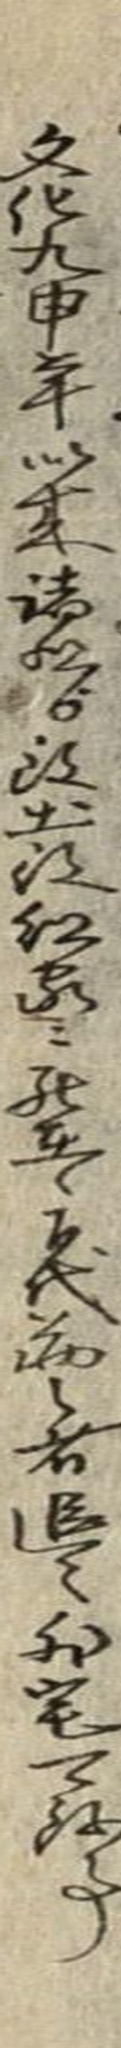文化九申年以来諸組ゟ致出役組家に罷在候下代勤之者追々外宅可致事
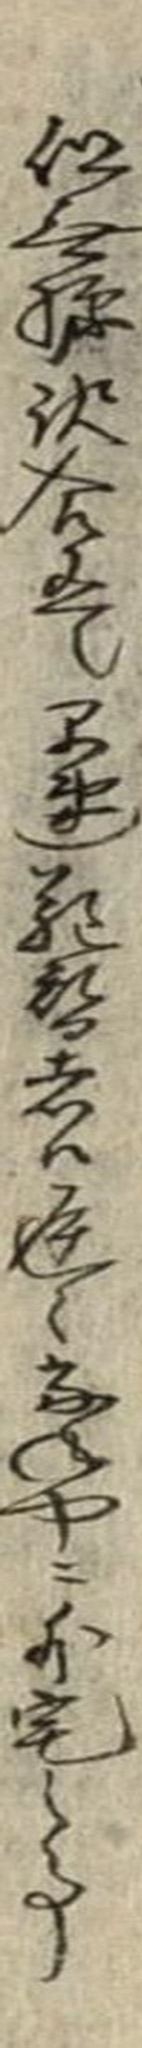但無拠訳合有之早速難替者は遅く当年中に外宅之事
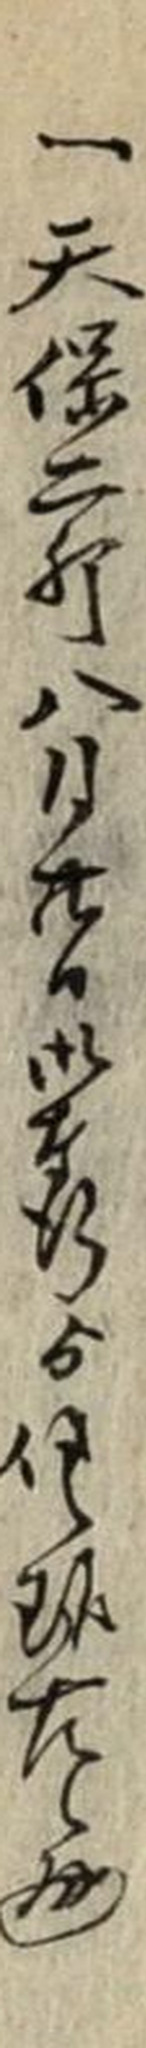一天保二卯八月廿日御奉行ゟ伺之趣左之通
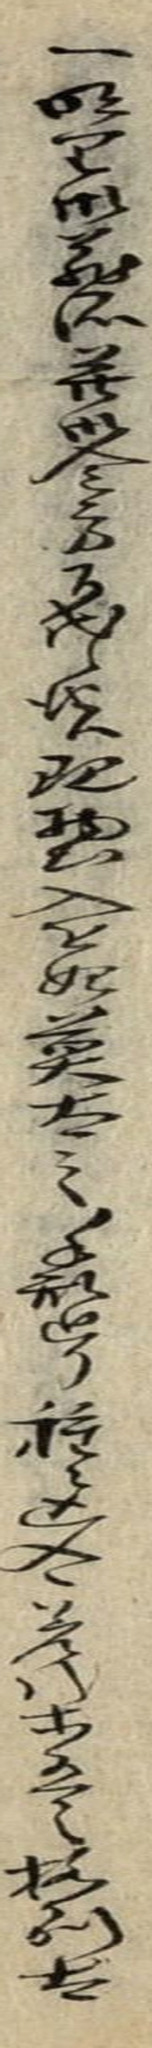一明里御蔵所并御金方下代之儀は現物出入を始莫太之手形廻り種々込入候差引等有之各別太
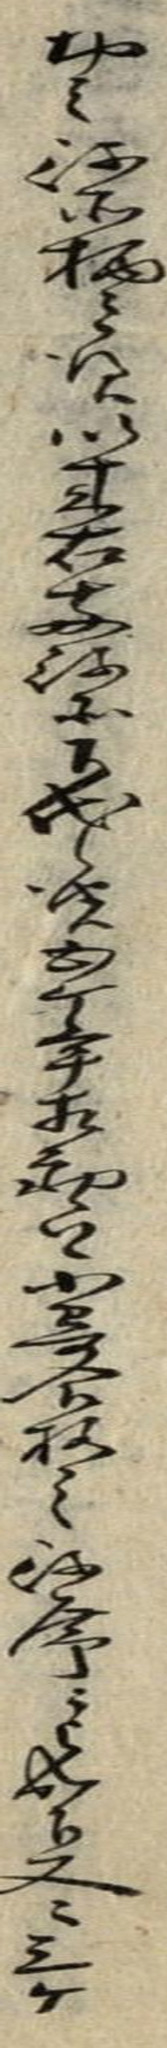切之役所柄に候得は以来右両役所下代之儀は五ヶ年相勤候はゝ小寄合格之役席に被成下又々三ヶ
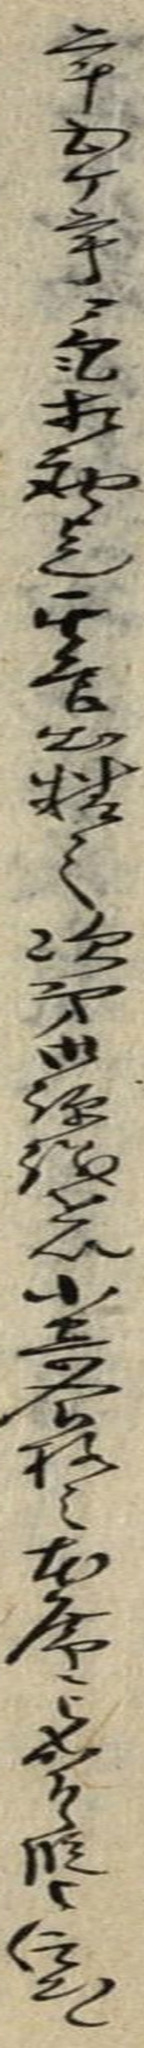年五ヶ年に而も相勤候迄其節出精之次第御評議を以小寄合格之本席に被成下候段被仰出候
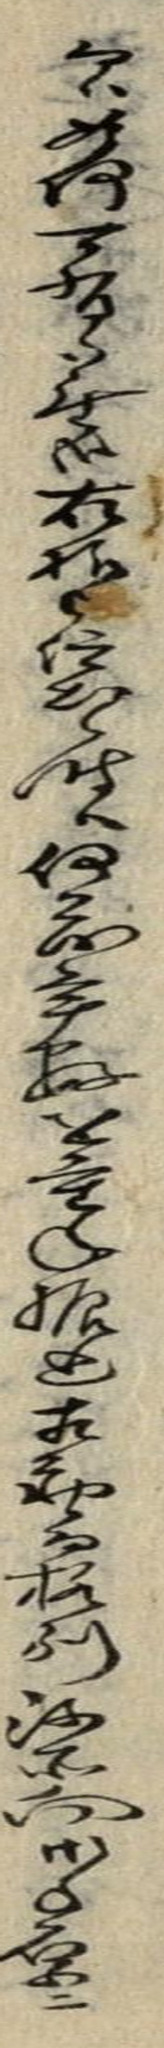而は如何可有御座哉右様被仰出候時は何も年数を重ね振込相勤候而格別役所向御手厚に
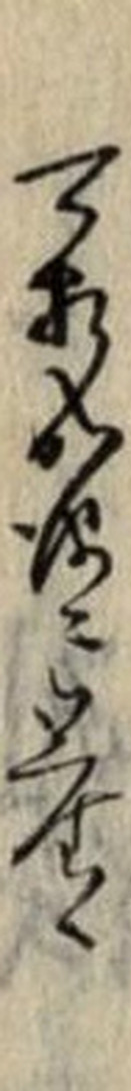可相成儀に御座候
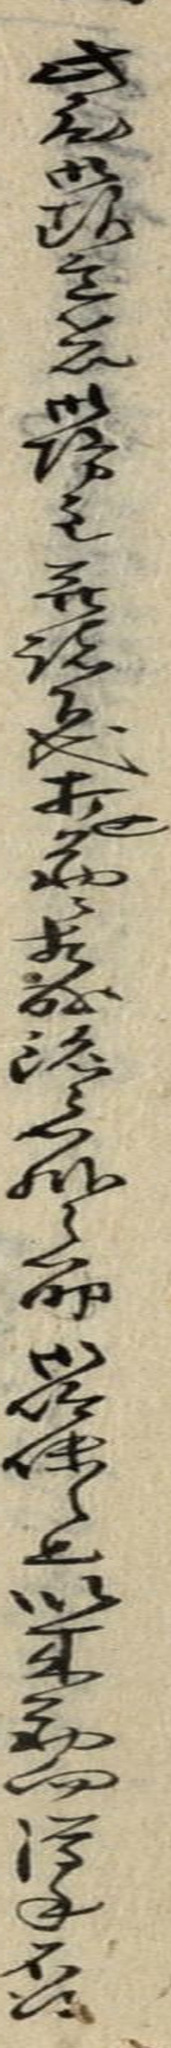一此度御趣意を以御坊主并諸下代打込勤に相成銘々心掛候筋御吟味之上以来勤向得手不得
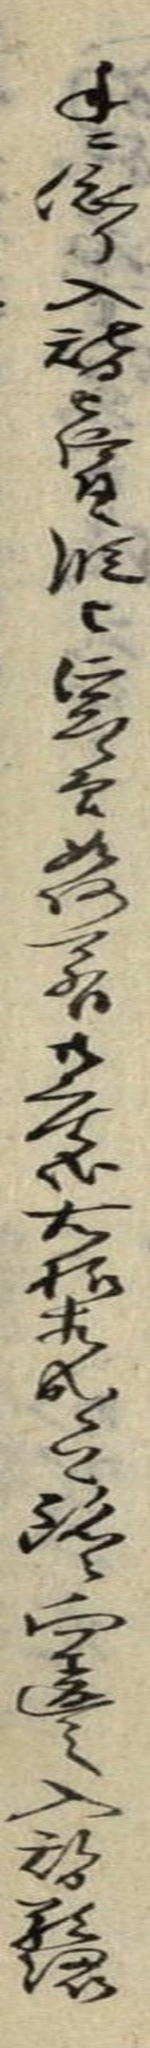手に依り入替被仰付候段被仰出候而は如何可有御座哉右様相成候はゝ銘々向違之入替難渋
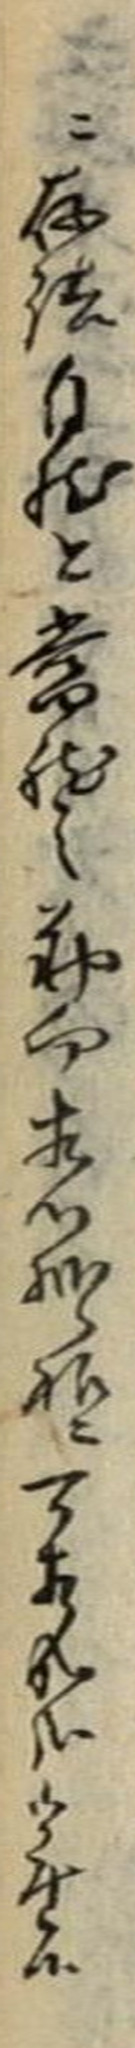に存詰自然と当然之勤向相心掛候様に可相成哉御座候
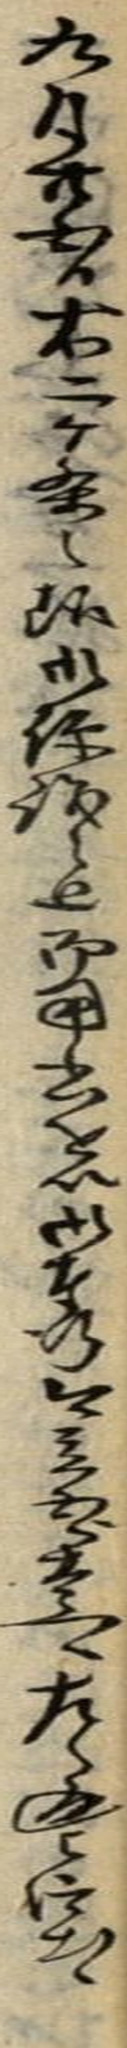九月廿五日右二ヶ条之趣御評議之上御用書を以御奉行今立五郎太夫へ左之通被仰出候
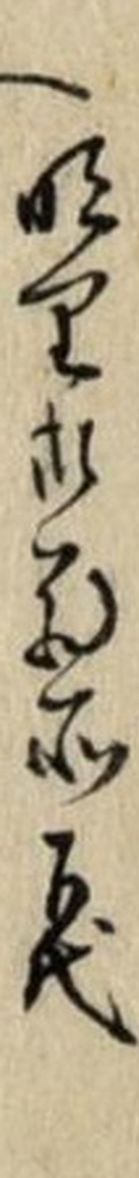明里御蔵所下代
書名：御用并被仰出之部
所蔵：福井県文書館 Fukui Prefectural Archives
